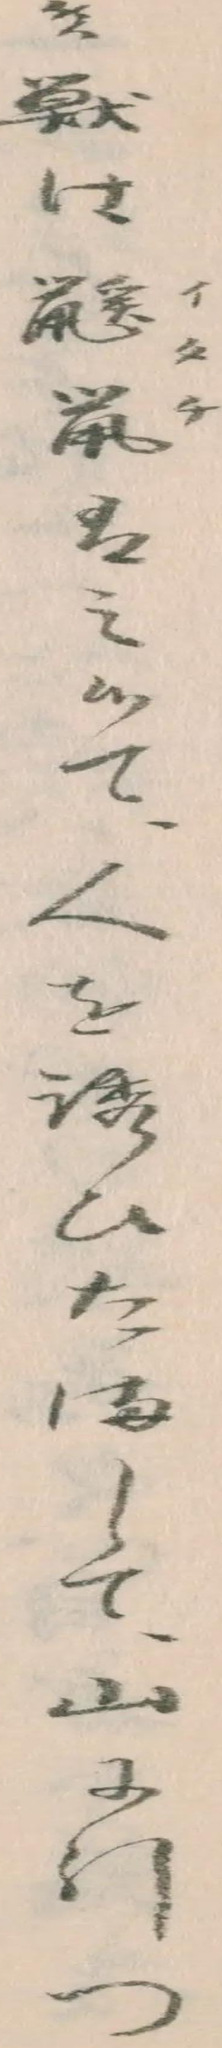候獣は鼷鼠有之候て、人を誘ひたまして、山に引つ
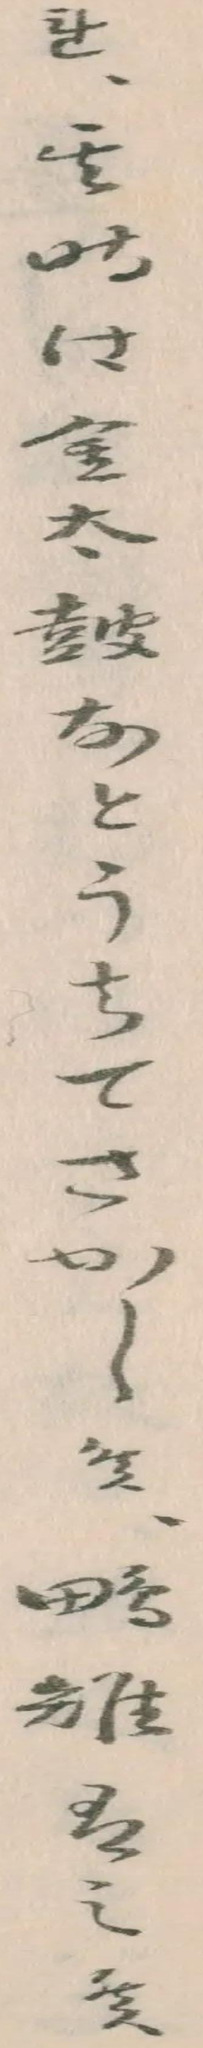れ、其時は金太鼓なとうちてさかし候、鴫雉有之候
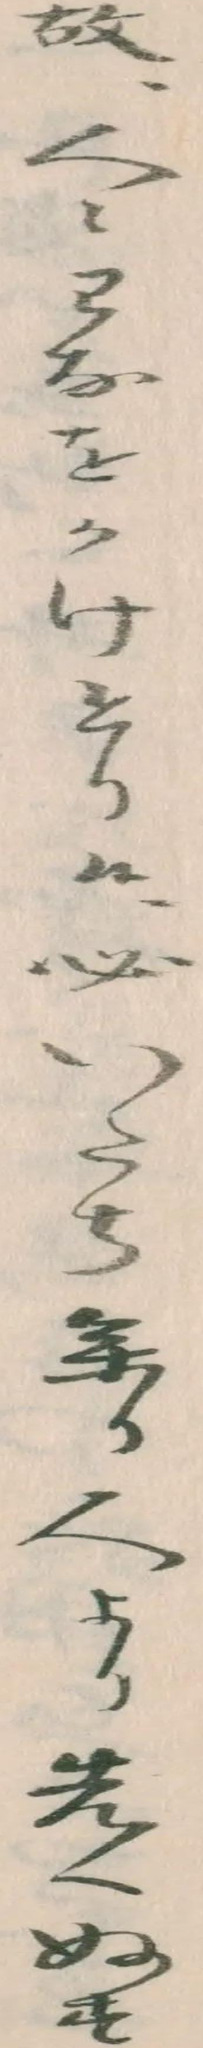故、人々わなをかけとり候、必いたち参り人より先へぬす
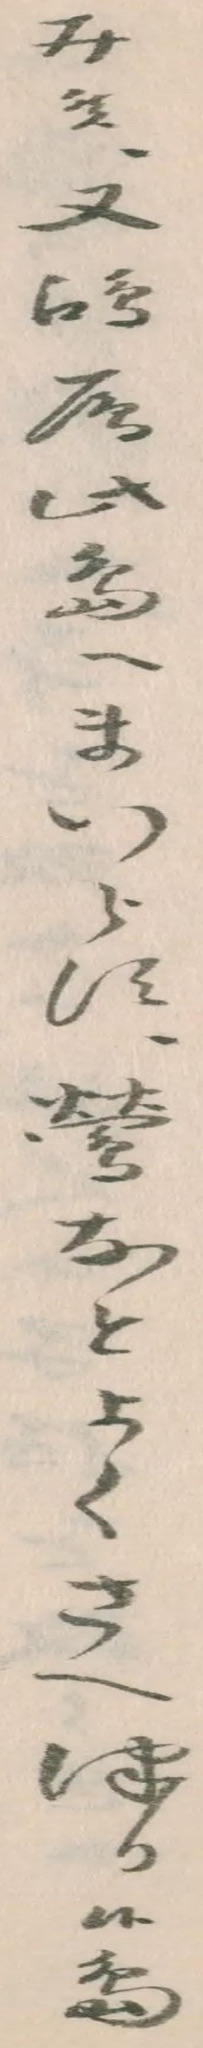み候、又鴻雁此島へまいらす、鶯なとよくさへつり候島
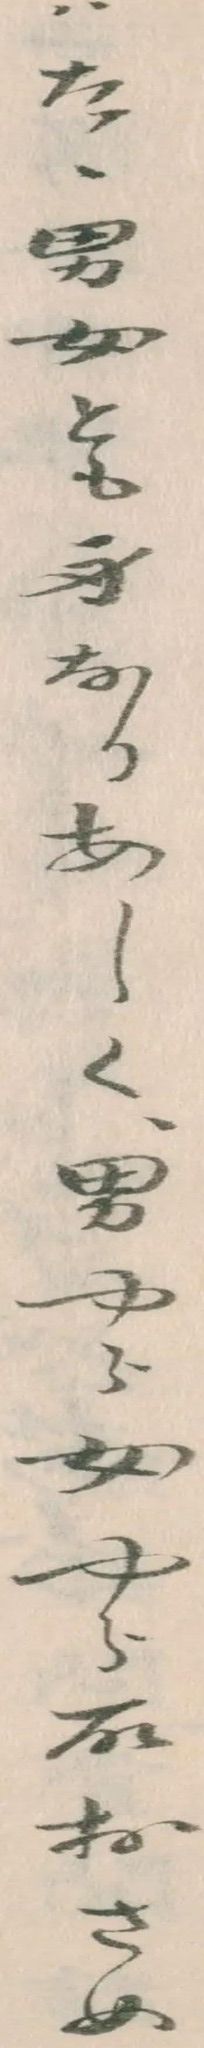はたゝ男女とも身なりあしく、男やら女やら取おさめ
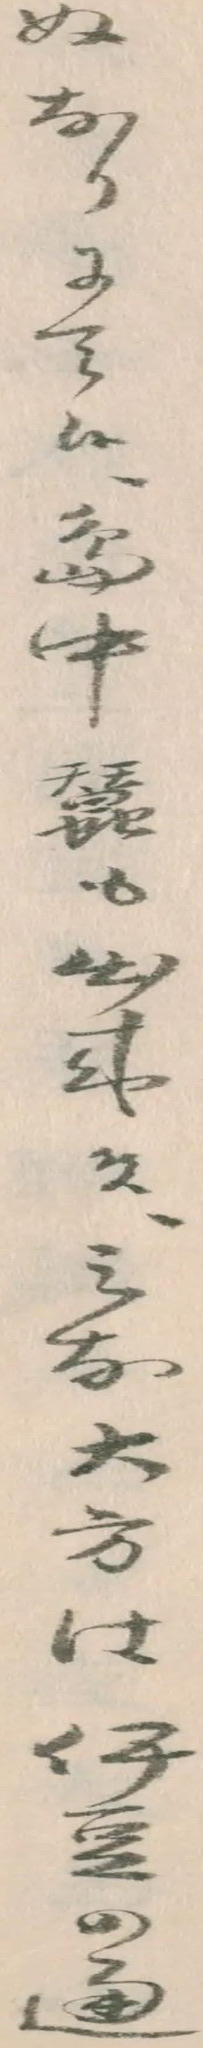ぬなりにて候、島中蠶も出来候、みな大方は伊豆の通
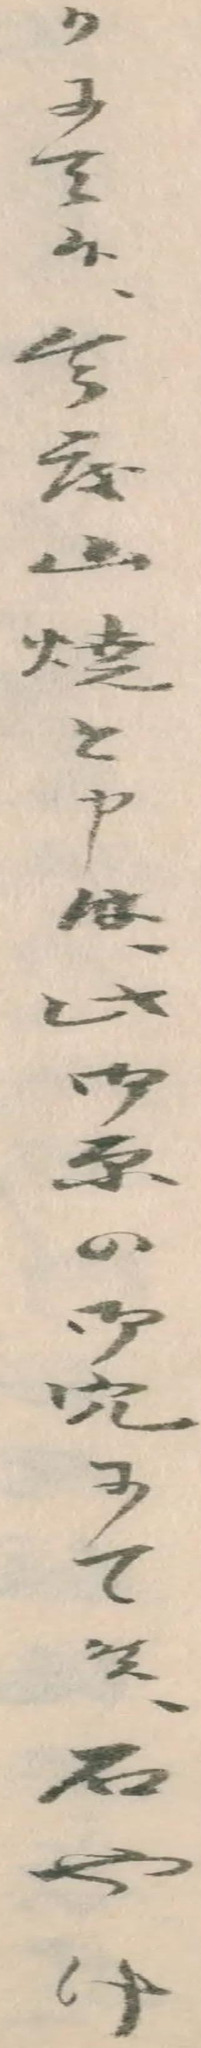りにて候、今度山焼と申は、此御原の御穴にて候、石やけ

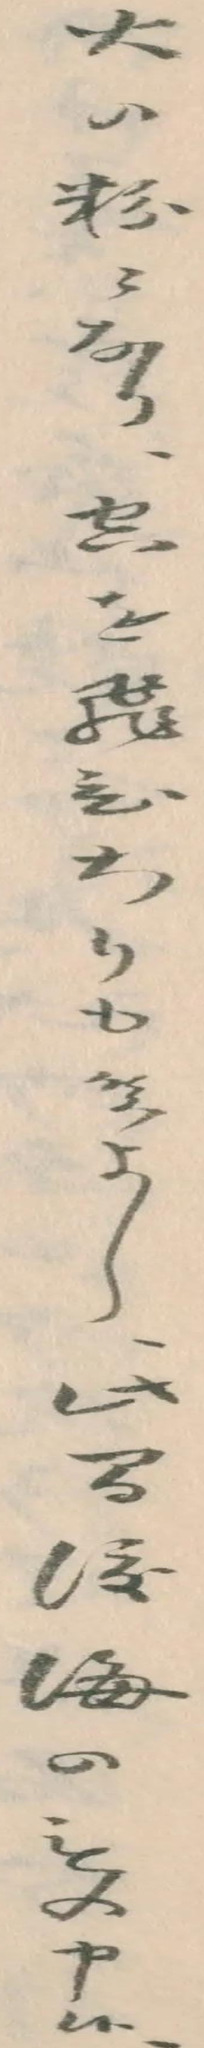火の粉になり、空を飛ひちりも候よし、此間渡海のもの申候、
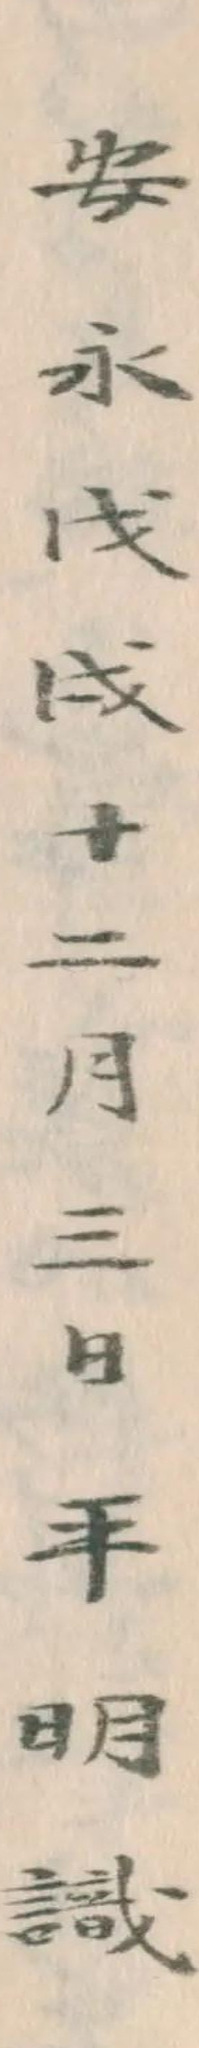安永戊戌十二月三日平明識
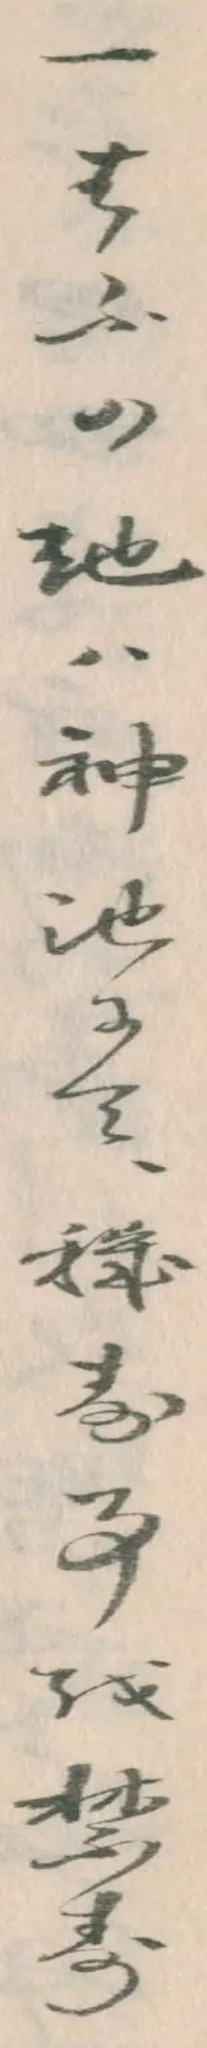一はふの池は神池にて、穢す事を禁す
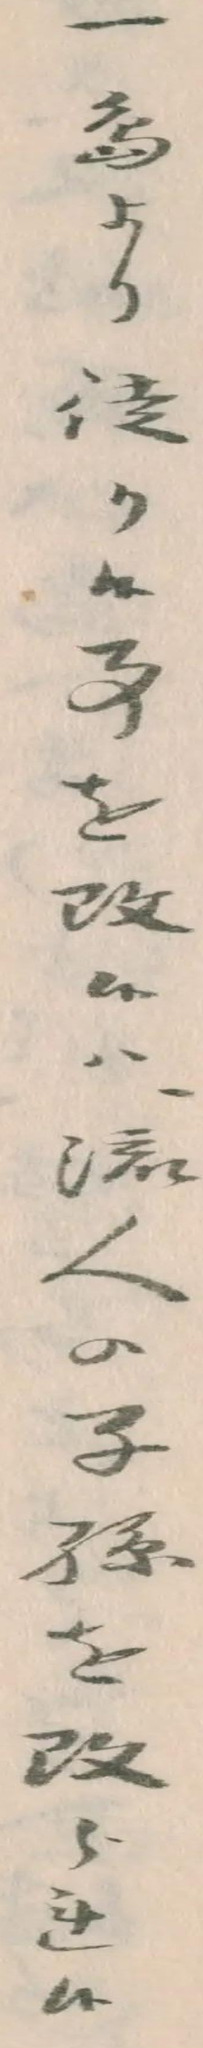一島より徒り候事を改候は、流人の子孫を改られ候
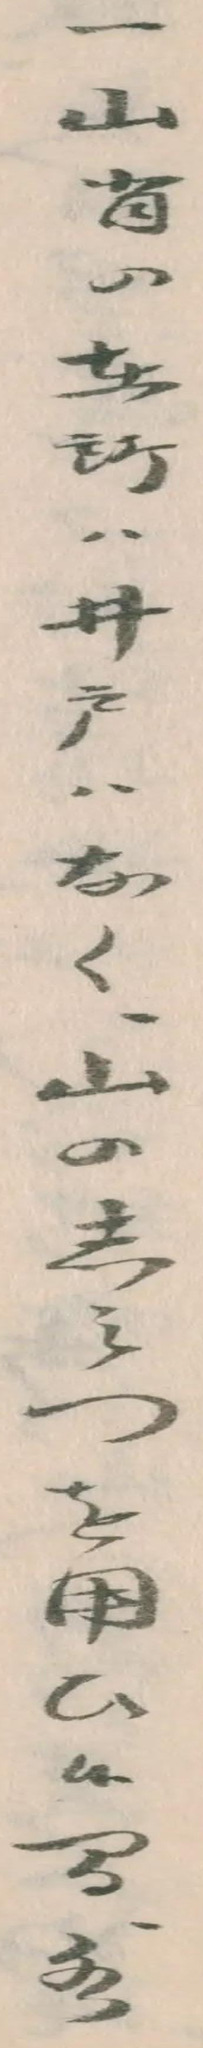一山背の在所は井戸はなく、山のしみつを用ひ候間、水
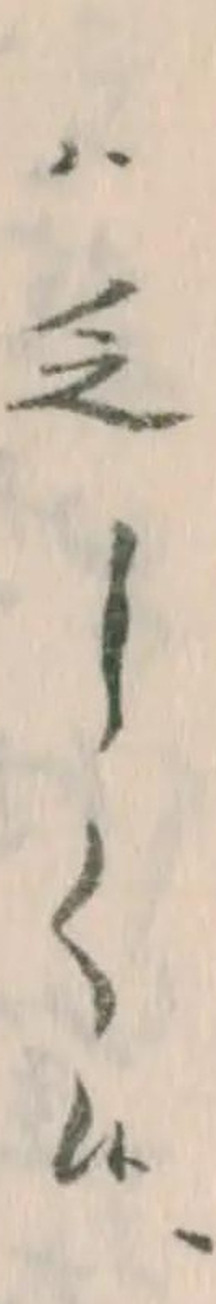は乏しく候、
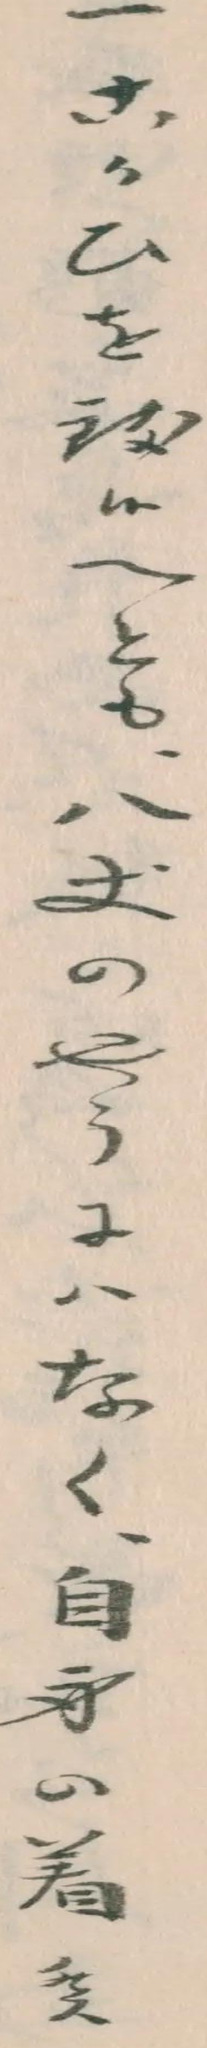一こかひを致候へとも、八丈のやうにはなく、自身の着候
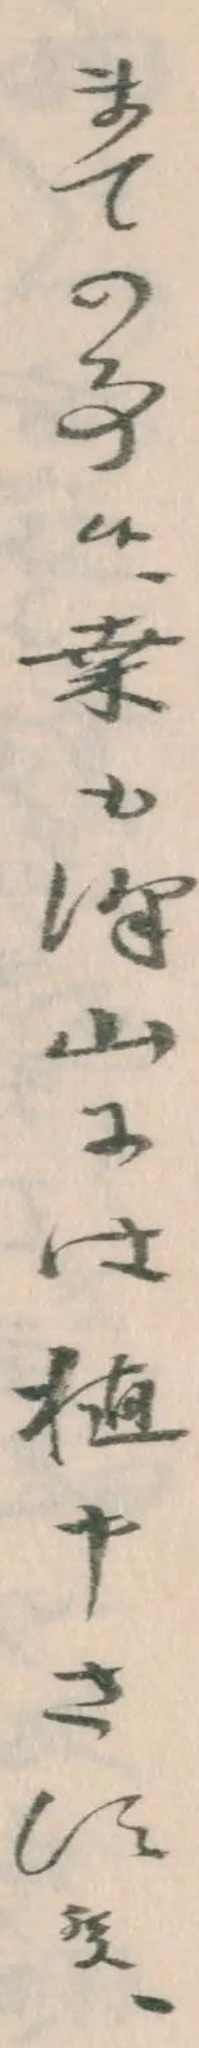まての事候、桑も沢山には植申さす候、
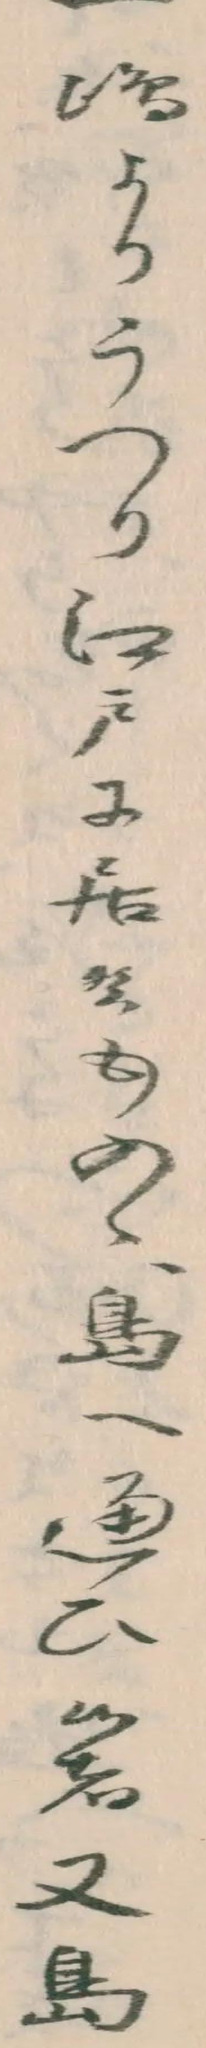一嶋よりうつり江戸に居候ものゝ、島へ通ひ候者又島
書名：地災撮要. 巻11-12(地震之部)
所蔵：国立国会図書館 National Diet Library, JAPAN
